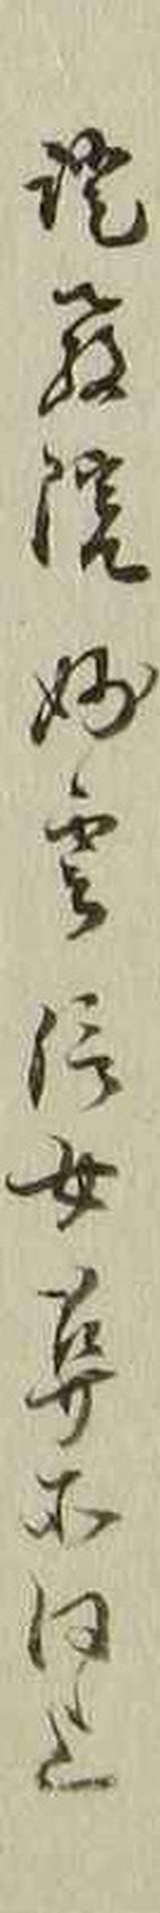燈厳院妙雲信女葬所同上
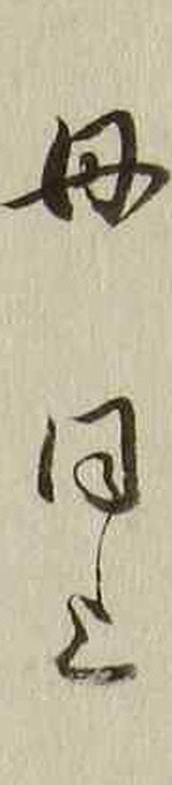母同上
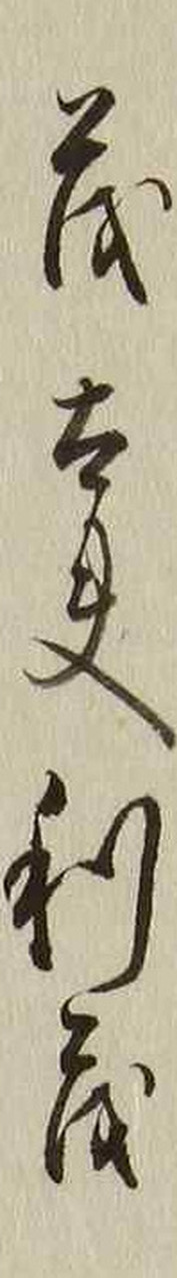茂太夫利置
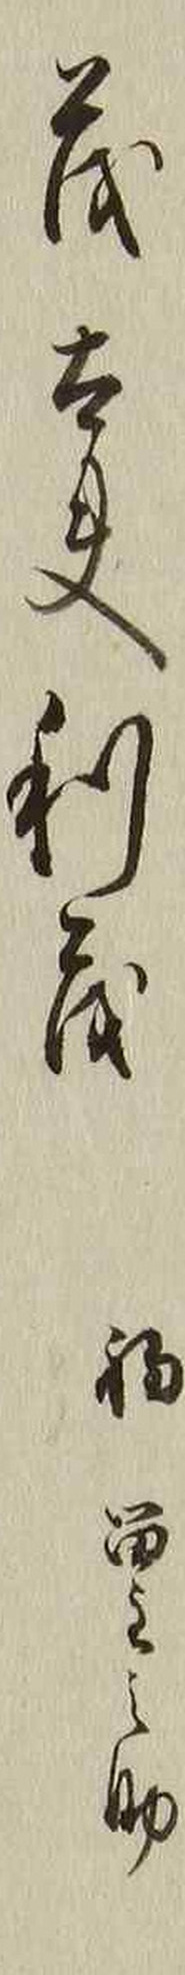茂太夫利茂初留主之助
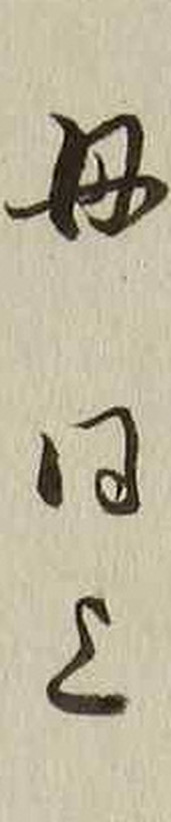母同上
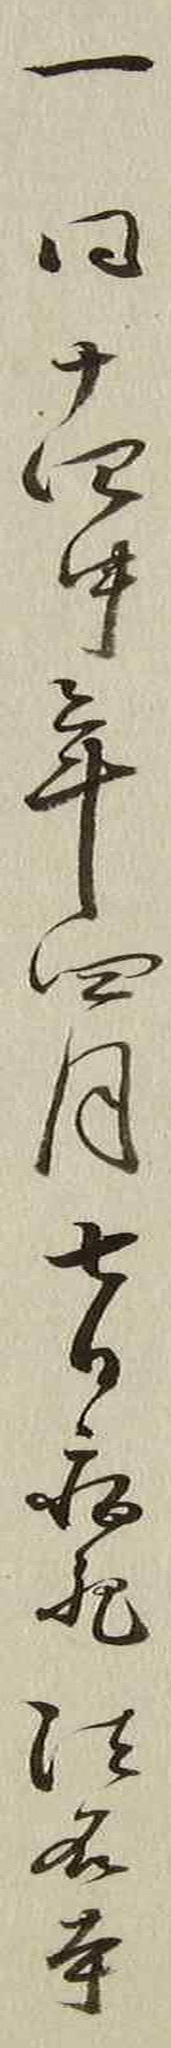一同十四午年四月七日病死法名寺
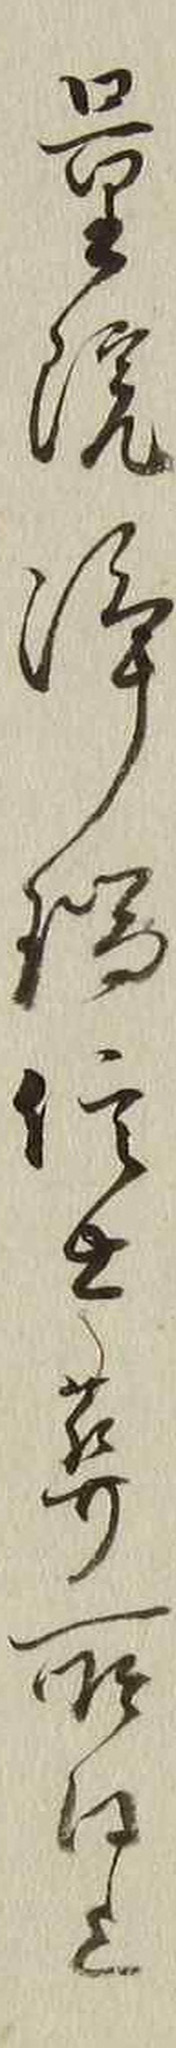量院浄瑙信士葬所同上
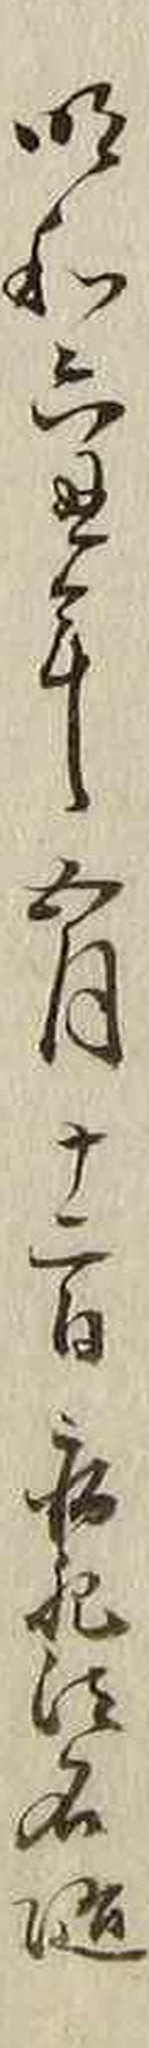明和六丑年五月十二日病死法名随
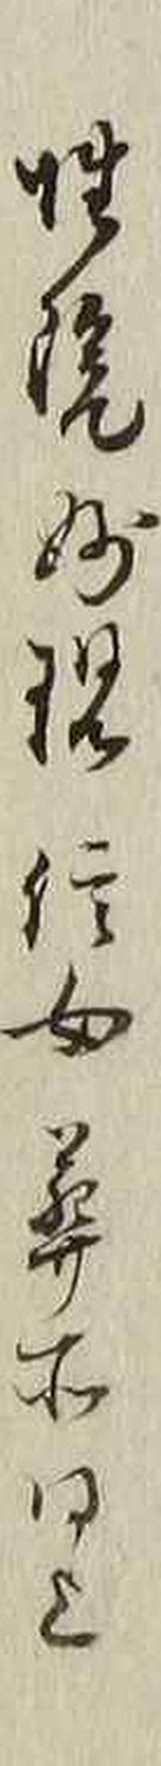性院妙現行女葬所同上
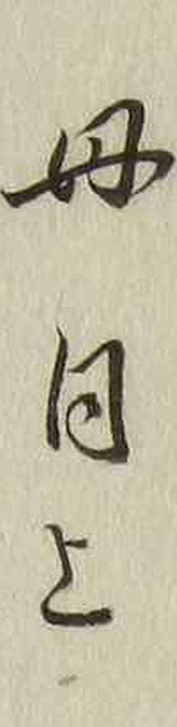母同上
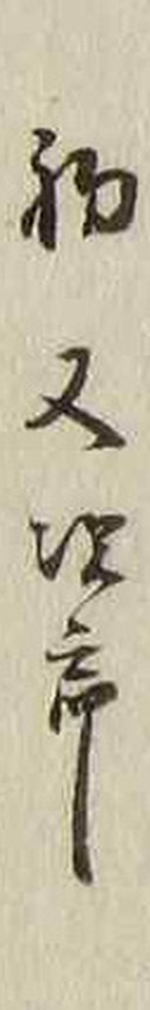初又次郎
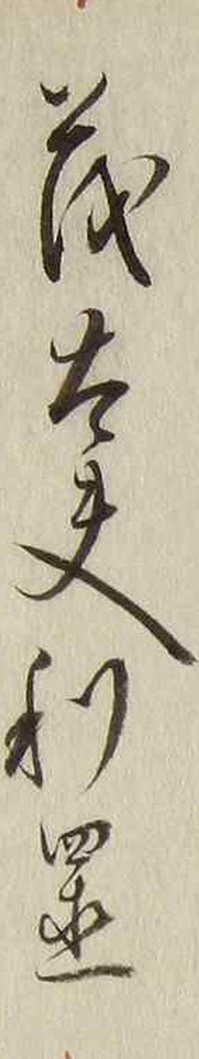茂太夫利置
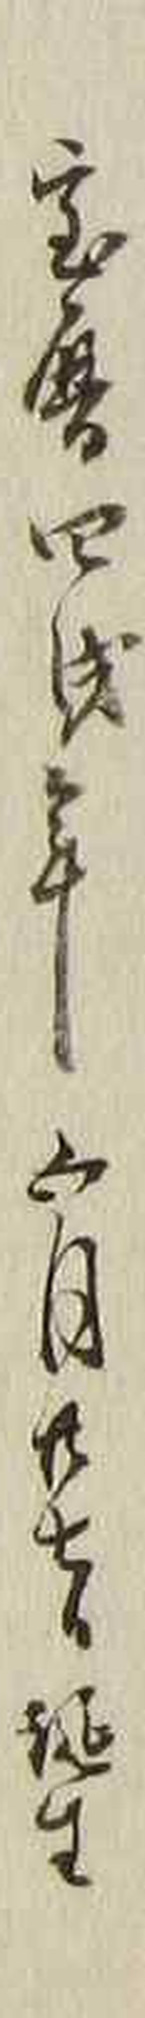宝暦四戌年五月廿七日誕生
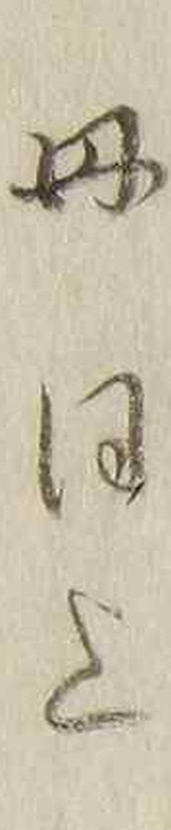母同上

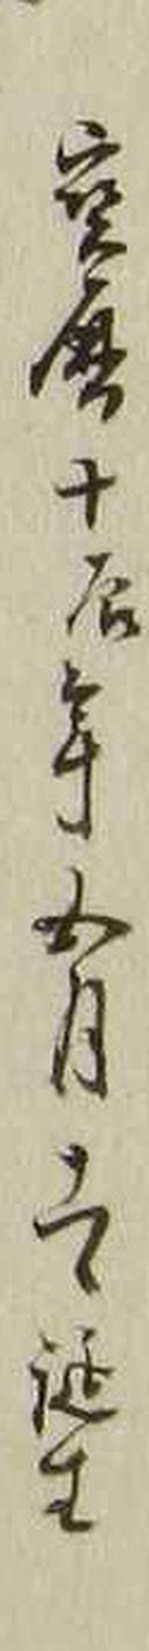宝暦十辰年五月十一日誕生
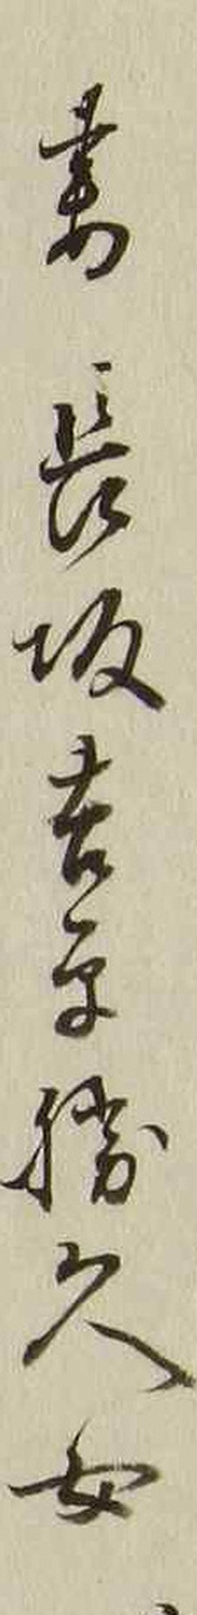妻長坂吉平勝久女
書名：諸士系譜　巻之20　い之部20
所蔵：会津若松市立会津図書館
